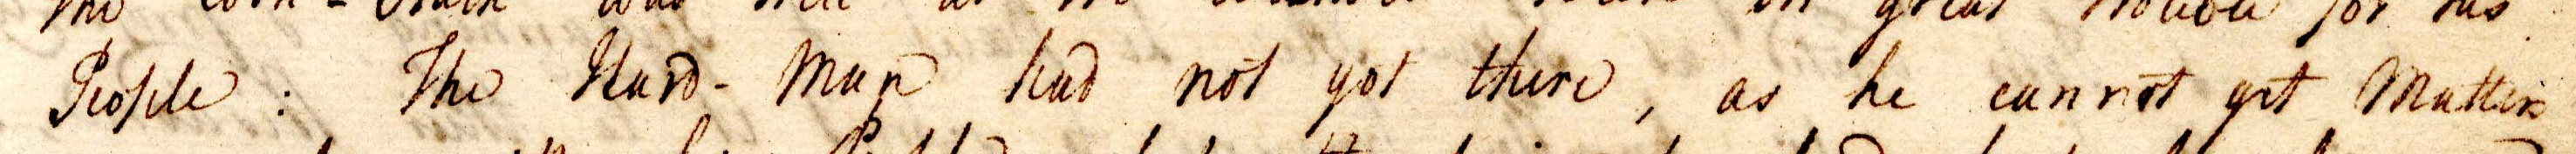People. The Hard-Man had not got there, as he cannot get Matters
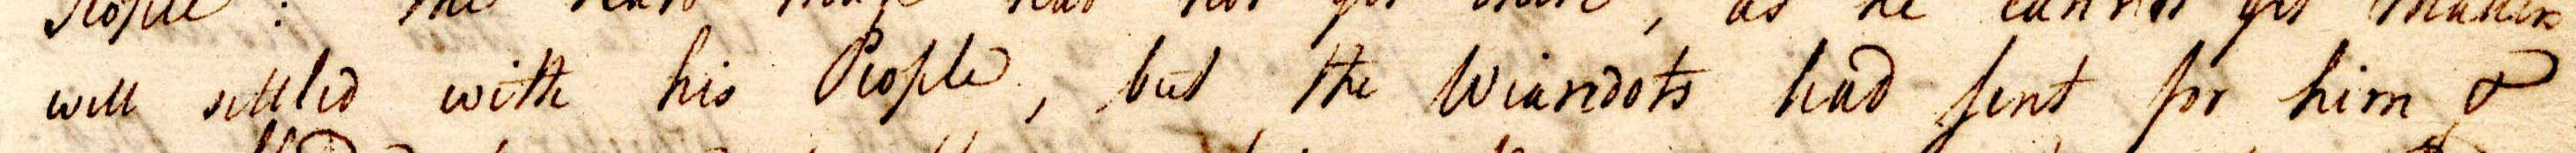well settled with his People, but the Wiandots had sent for him &
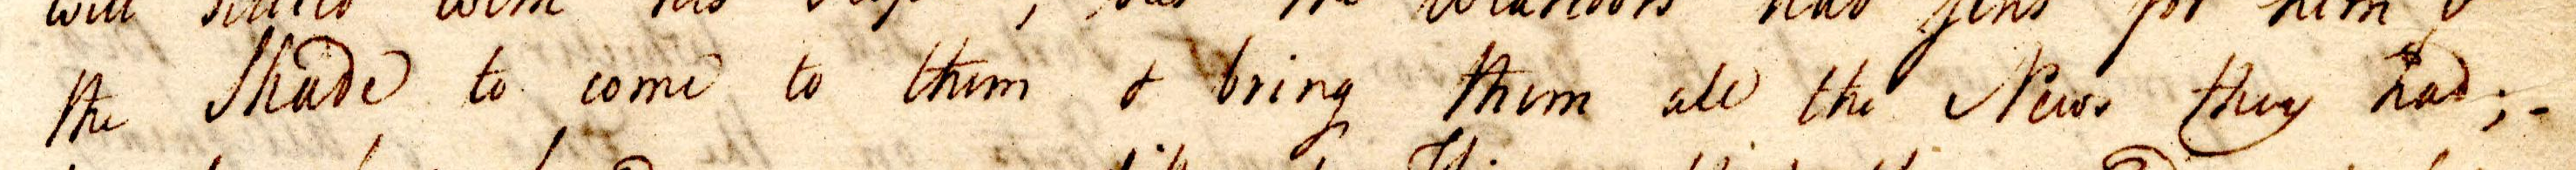the Shade to come to them & bring them all the News they had;
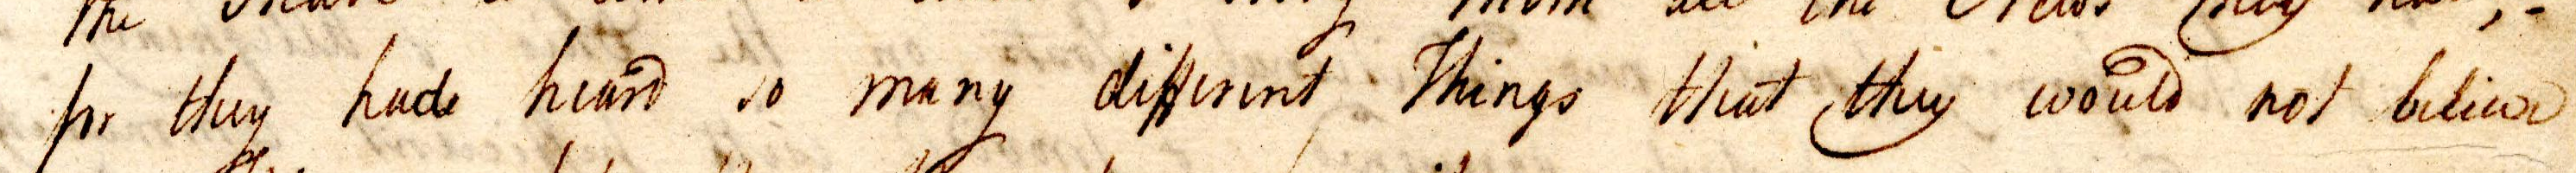for they had heard so many different Things that they would not believe
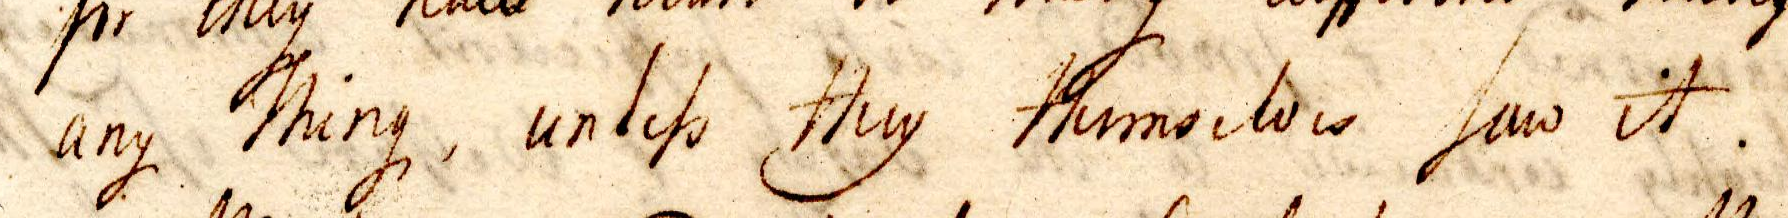any thing, unless thy themselves saw it.
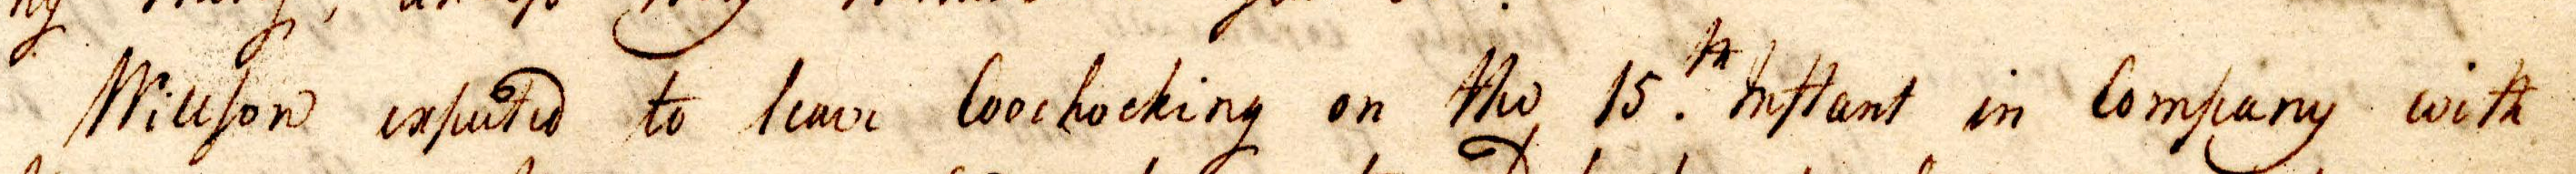Willson expected to leave Coochocking on the 15^th. Instant in Company with
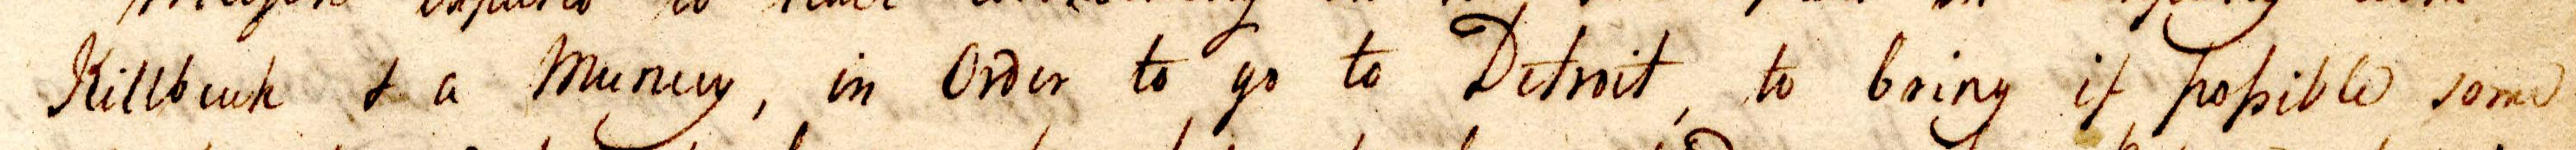Killbuck & a Muncy, in order to go to Detroit, to bring if possible some
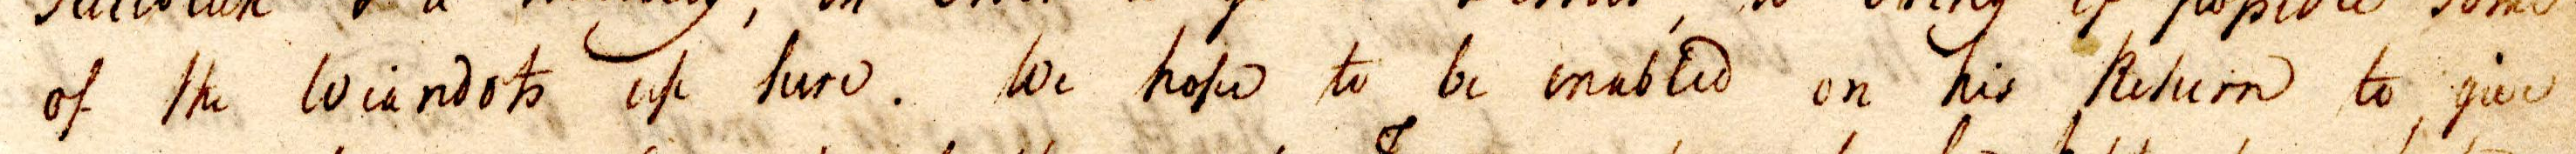of the Wiandots up here. We hope to be enabled on his Return to give
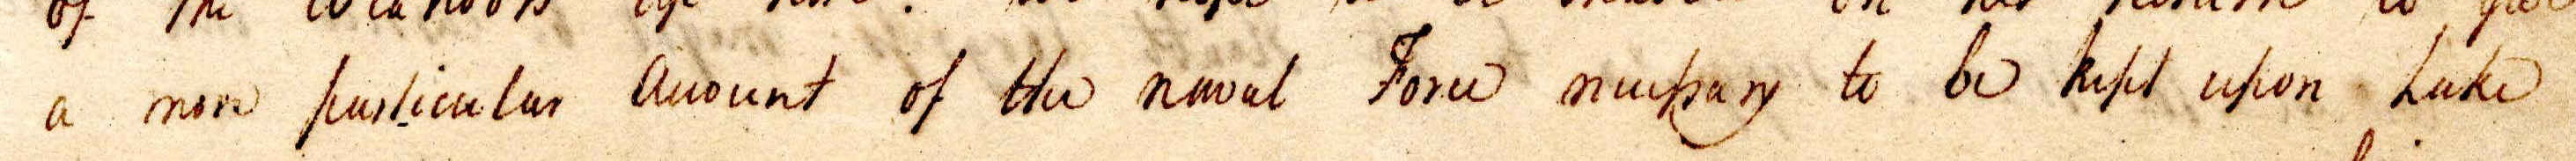a new particular account of the naval Force necessary to be kept upon Lake
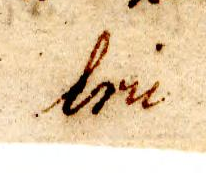Erie
